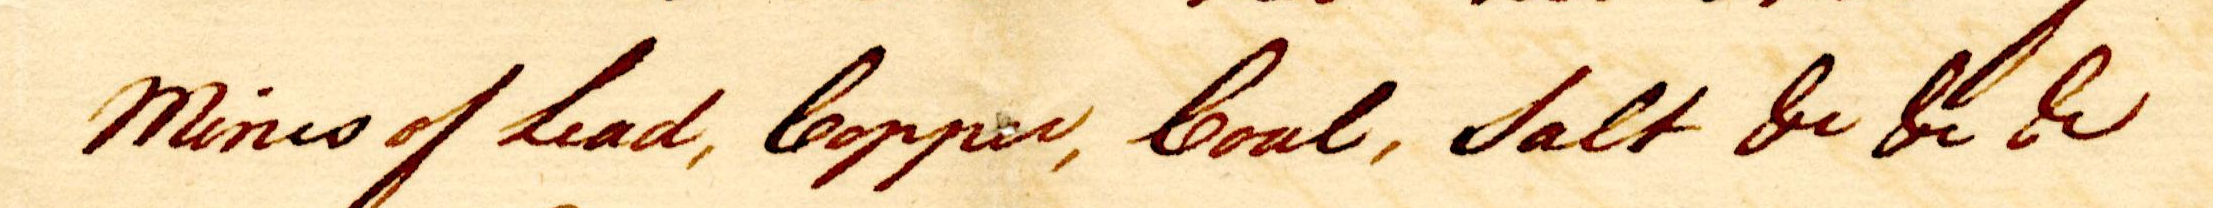Mines of Lead, Copper, Coal, Salt &c &c &c
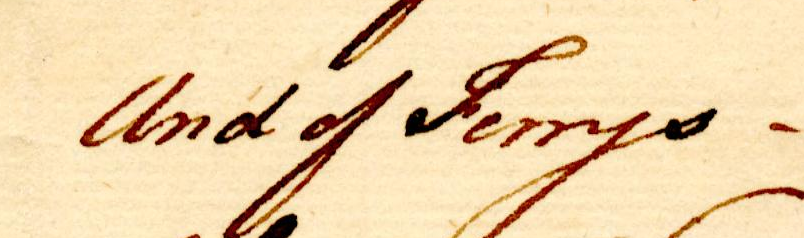And of Ferrys
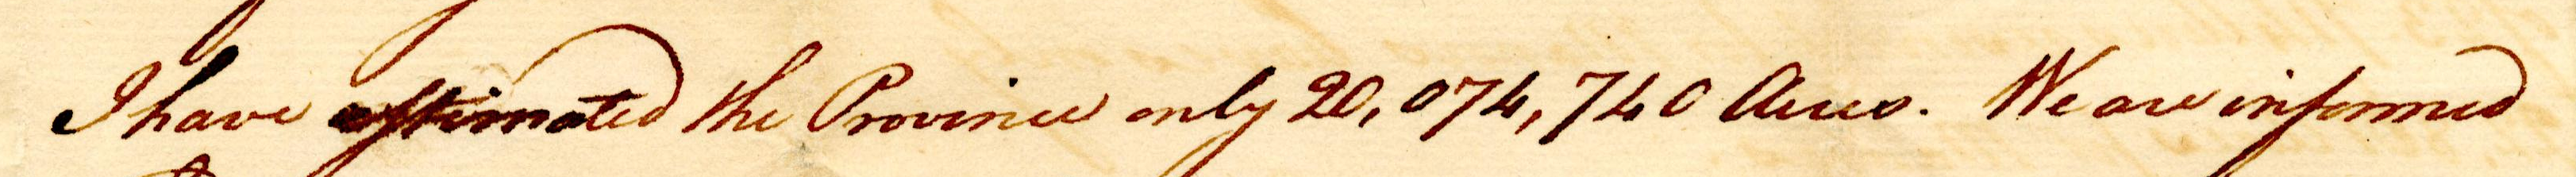I have estimated the Province only 20,074,740 acres. We are informed
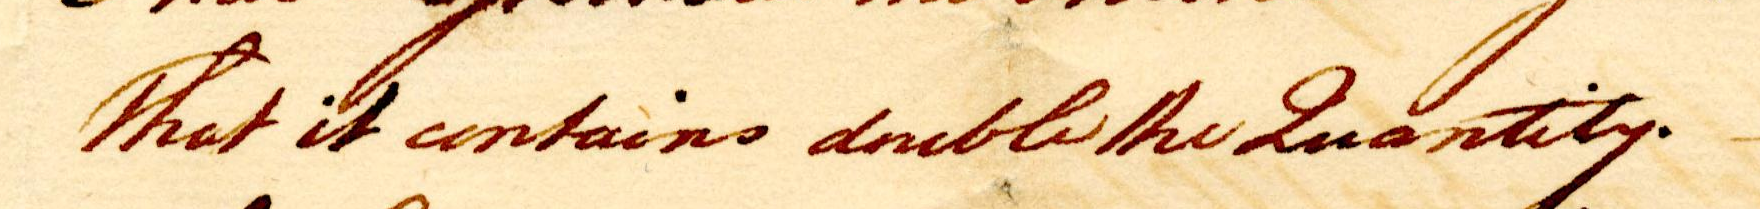that it contains double the Quantity.
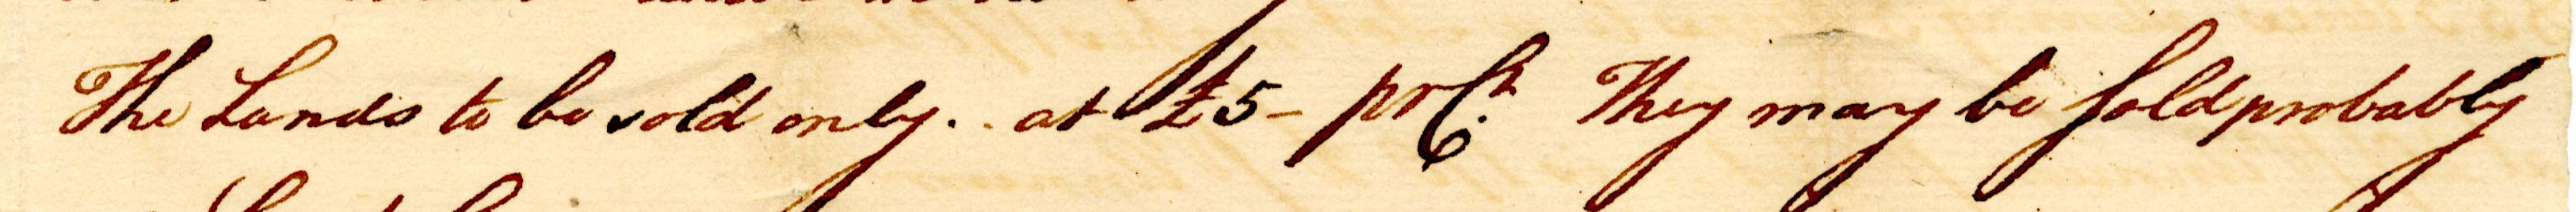The Lands to be sold only.. at £5- pr C^t. They may be sold probably
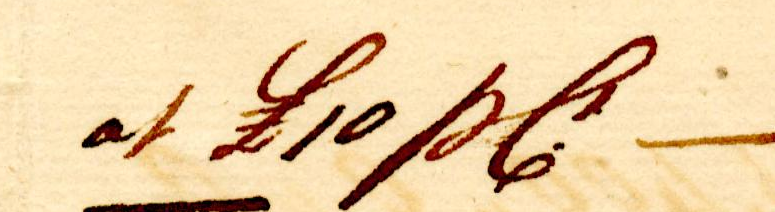at £10 pC^t.
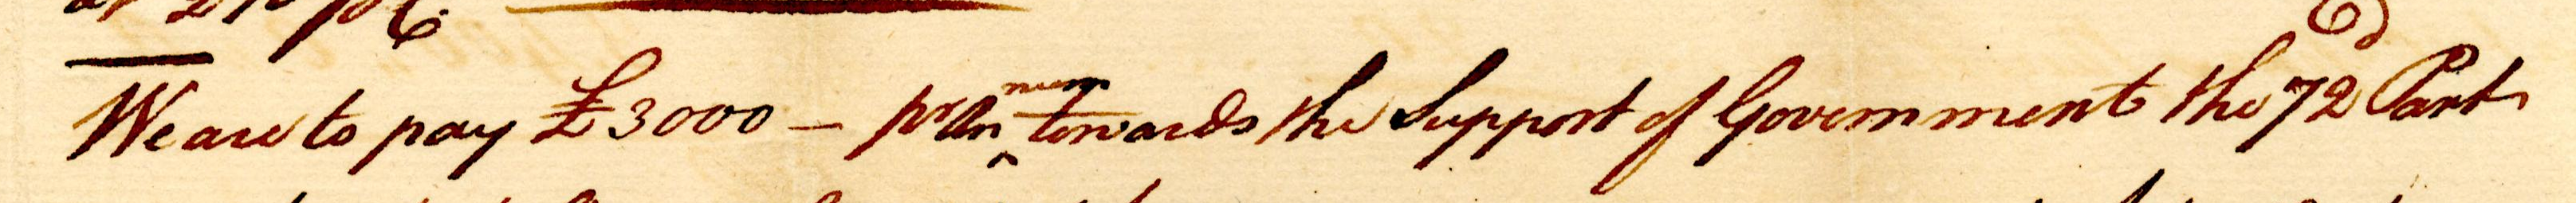We are to pay £ 3000- p^r An ^ towards the Support of Government the 72^d Part
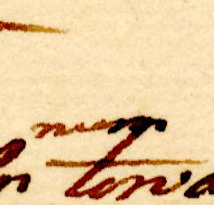num
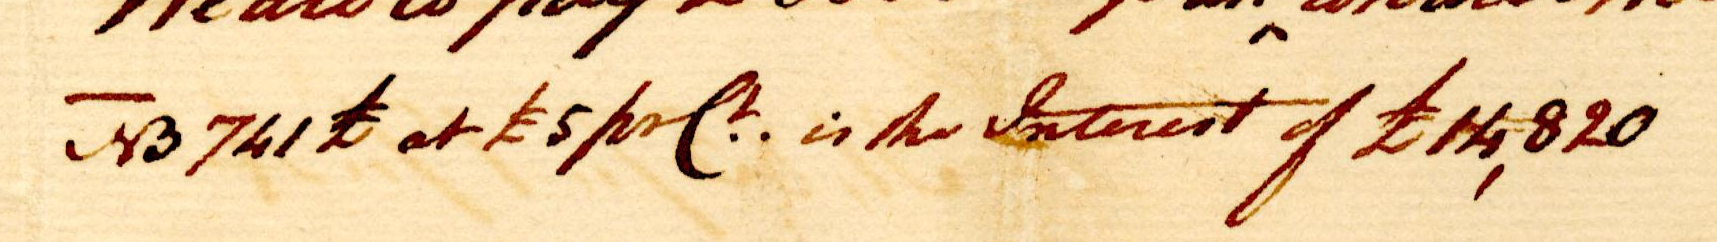NB 741£ at £5 p^r C^t. in the interest of £14,820
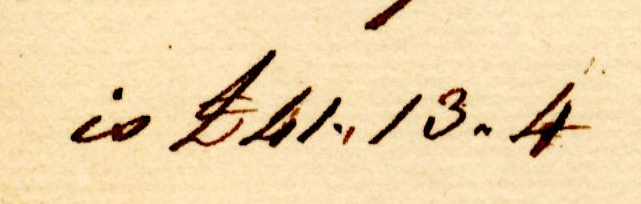is £41.13.4
